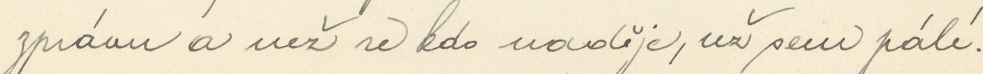zprávu a než se kdo naděje, už sem pálí.
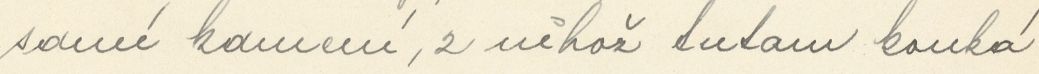samé kamení, z něhož tutam kouká
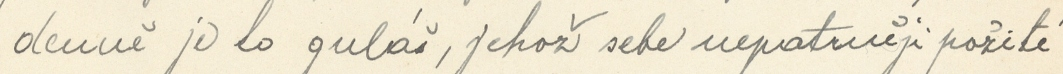denně je to guláš, jehož sebe nepatrněji požité
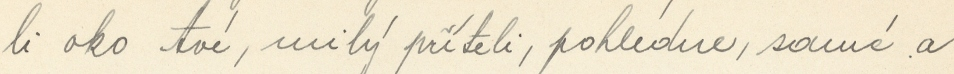li oko tvé, milý příteli, pohlédne, samé a
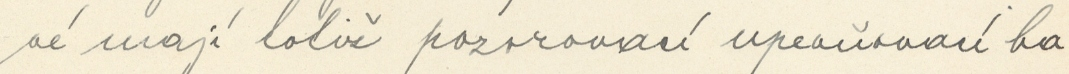vé mají totiž pozorovací upevňovací ba-
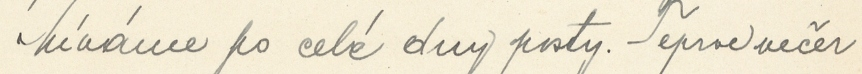Míváme po celé dny posty. Teprve večer
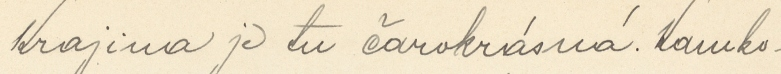Krajina je tu čarokrásná. Kamko-
